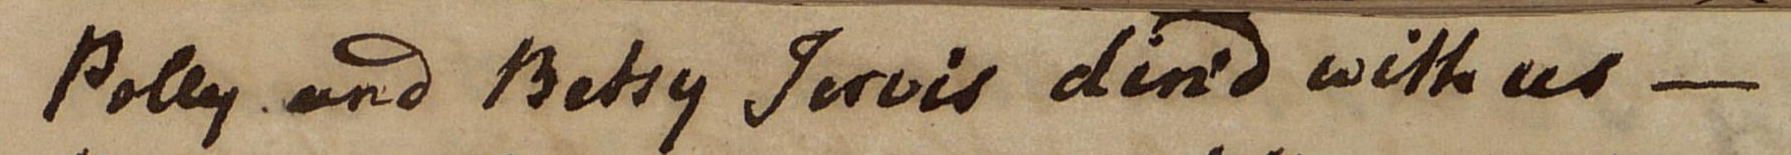Polly and Betsy Jervis din'd with us-
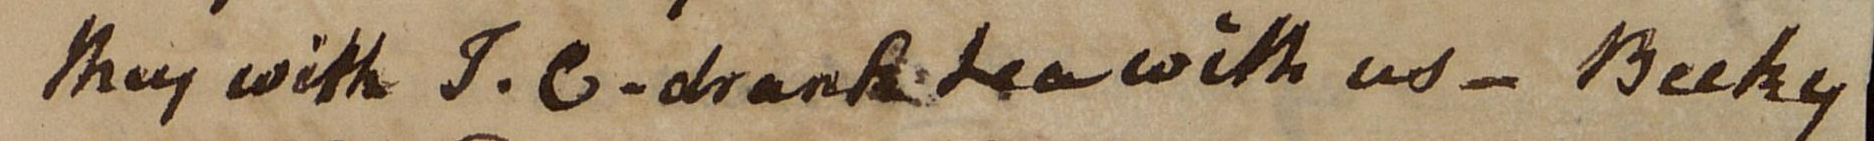they with J.C.- drank tea with us- Becky
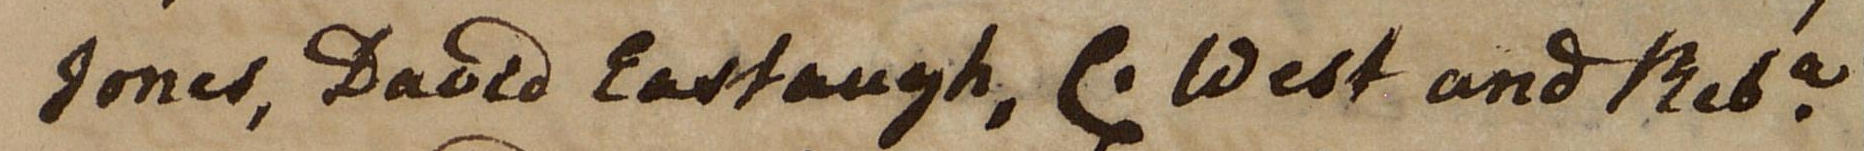Jones, David Eastaugh, C. West and Reb^a.
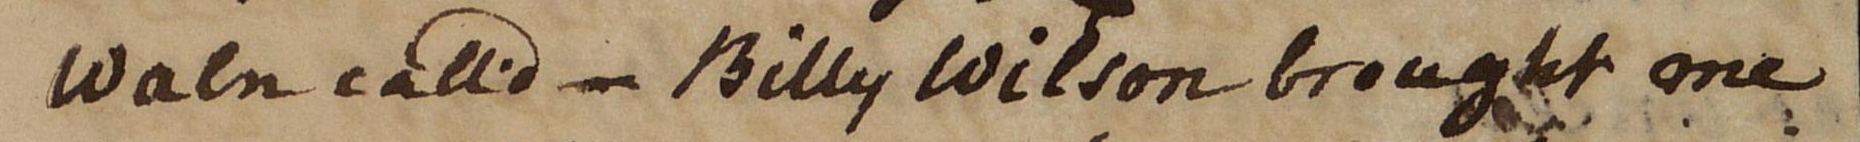Waln call'd- Billy Wilson brought me
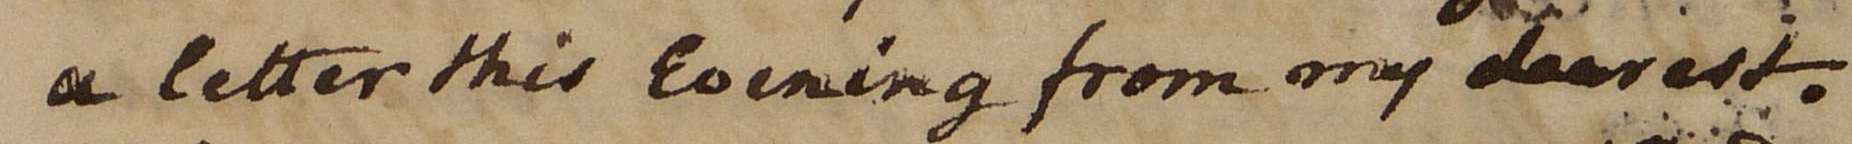a letter this Evening from my dearest.
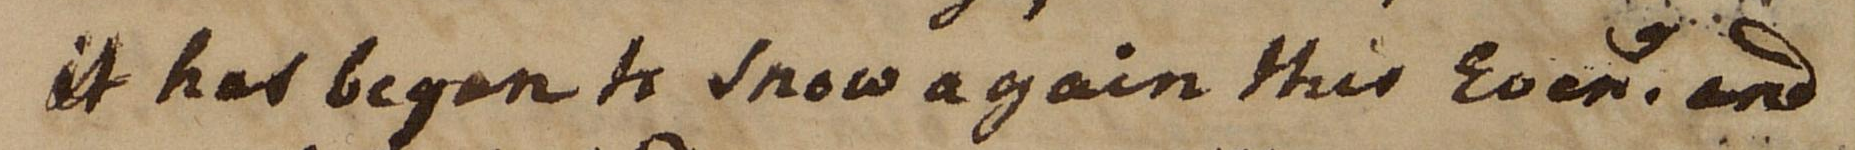it has began to snow again this Even^g. and
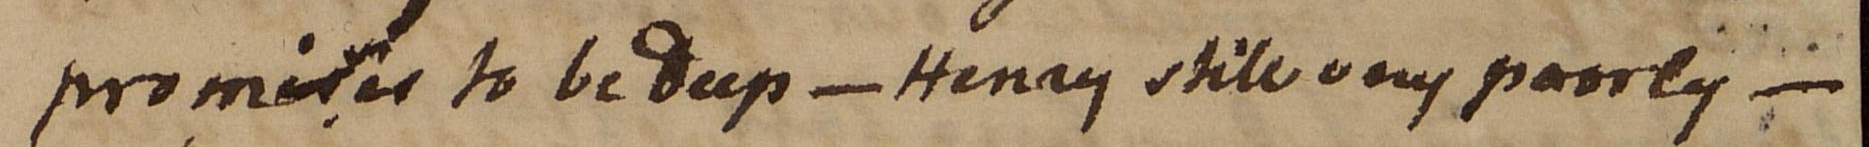promises to be deep- Henry still very poorly-
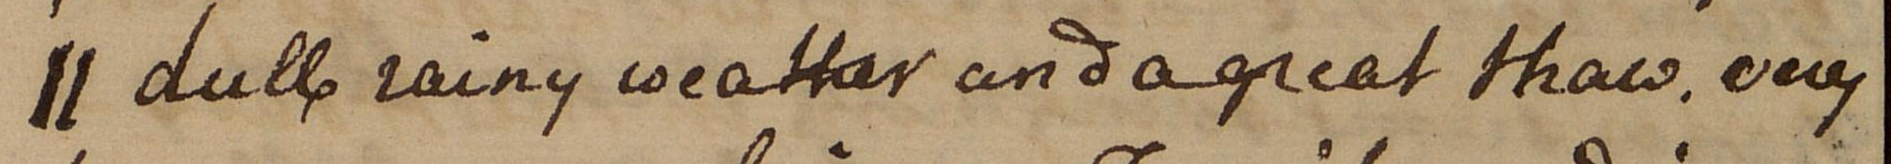11 dull rainy weather and a great thaw, very
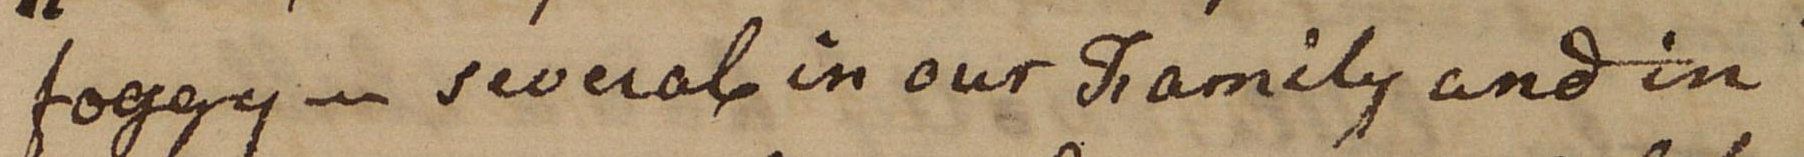foggy- several in our Family and in
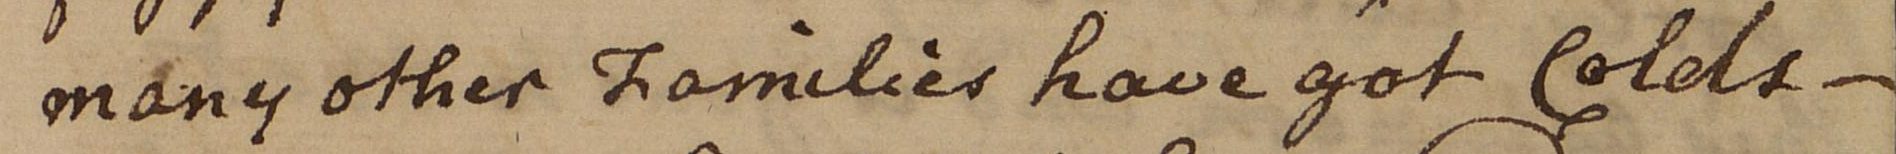many other Families have got Colds-
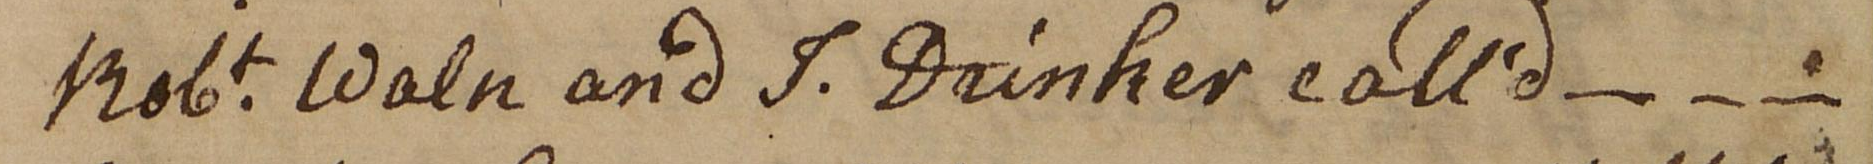Rob^t. Waln and T. Drinker call'd---
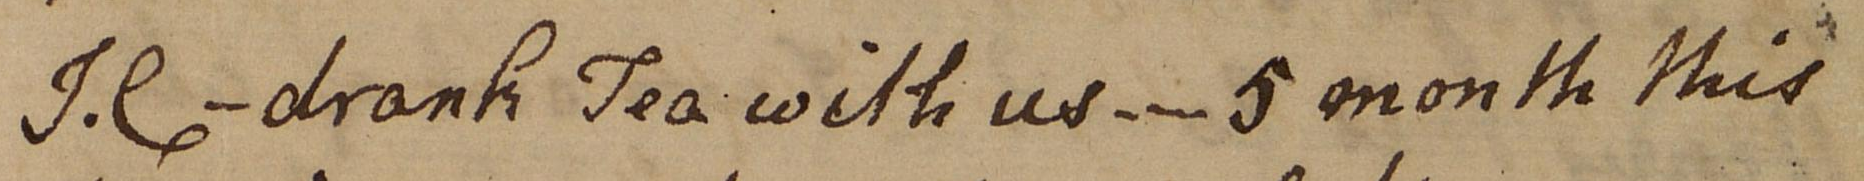J.C- drank Tea with us- 5 month this
